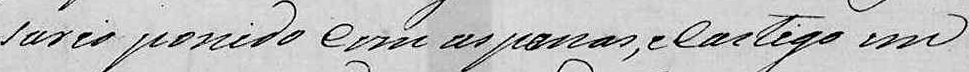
sario ponido com as penas, e castigo em
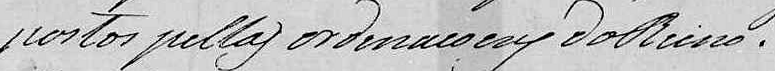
postos pellas ordenaçoens do Reino.
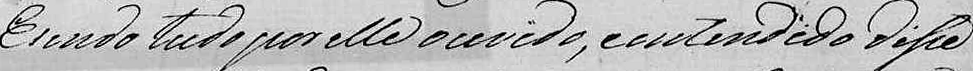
E sendo tudo por elle ouvido, e entendido disse
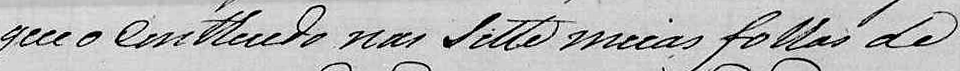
que o contheudo nas sette meias folhas de
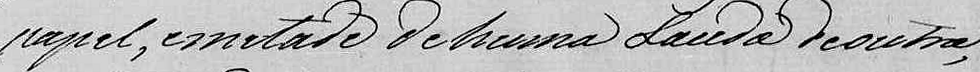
papel, e metade de huma lauda de outra,
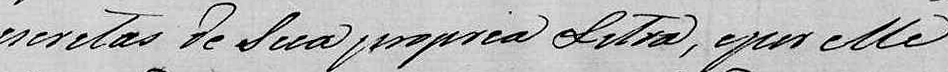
escretas de sua propria letra, e por elle
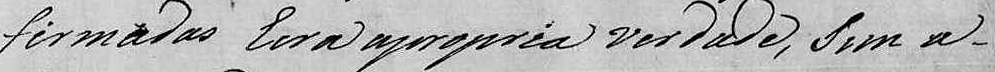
firmadas hera a propria verdade, sem a
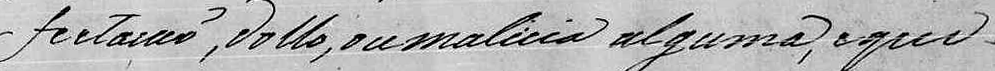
fectaçaõ, dollo, ou malicia alguma, e que
